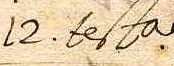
i2. testa.
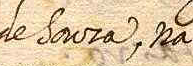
de Souza, na
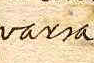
varra
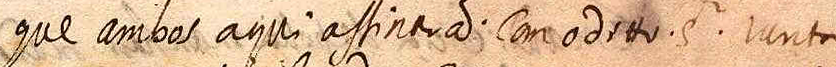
que ambos aqui assinaraõ com o ditto .sor. iunta
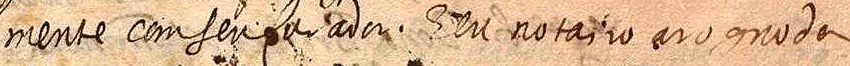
mente com seu Curador. E eu notairo a roguo da
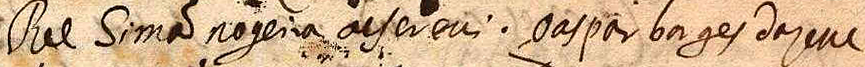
Ree Simaõ nogeira o escreui. gaspar borges dazeue
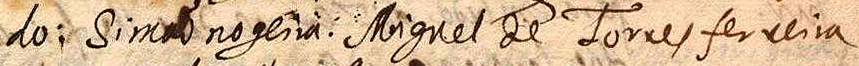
do. Simaõ nogeira. Miguel de Torres ferreira
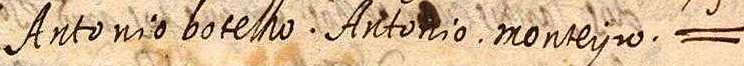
Antonio botelho. Antonio monteyro.
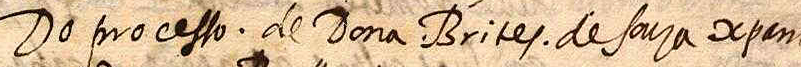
Do processo de Dona Brites de Souza xpam
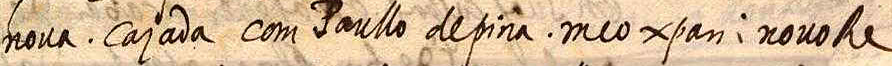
noua cazada com Paullo de pina meo xpam nouo Re
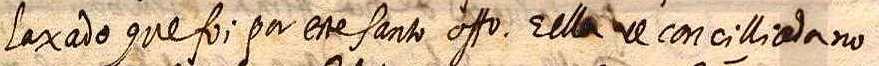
laxado que foi por este santo offo. E ella reconcilliada no
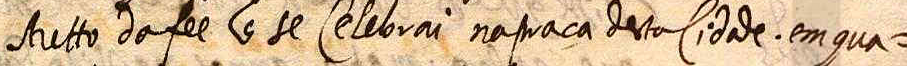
Autto da fee q̄ se Celebrou na praça desta Cidade. em qua
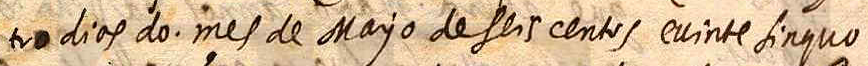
tro dias do mes de Mayo de seiscentos e uinte sinquo
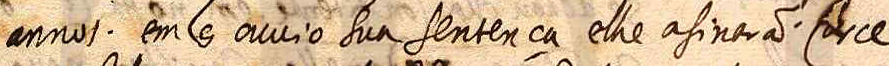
annos. em q̄ ouuio sua sentença e lhe asinarā. Carce
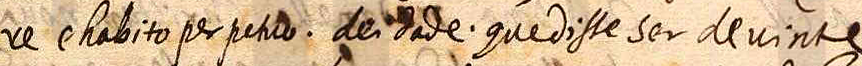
re e habito perpetuo de idade que disse ser de uinte
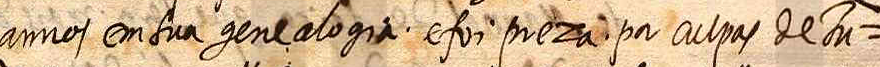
annos em sua genealogia e foi preza por culpas de Iu
